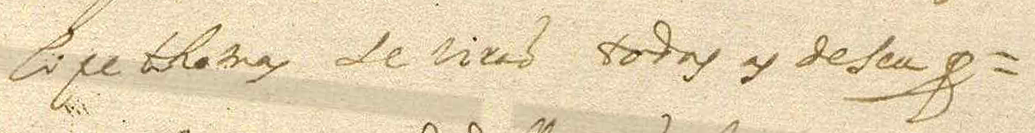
lipe thomas se viraõ todas as de seu ꝓ
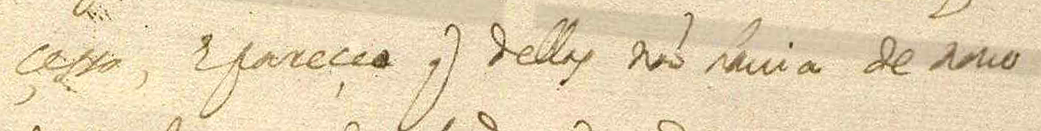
cesso, E pareceo q̄ dellas naõ hauia de nouo
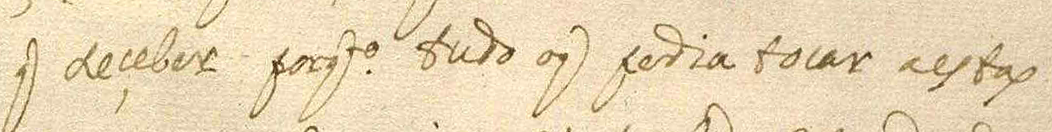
q̄ receber porq.to tudo o q̄ podia tocar a estas
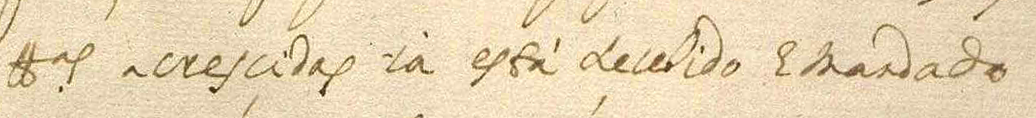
tt.as acrescidas ia está recebido E mandado
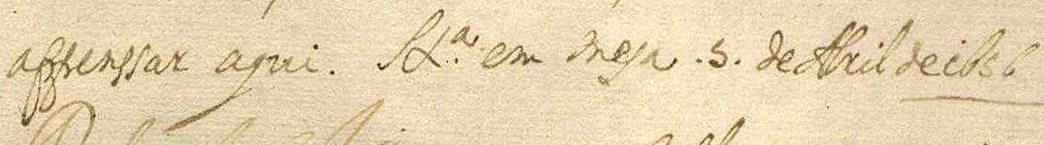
appenssar aqui. Lx.a em mesa .5. de Abril de i656
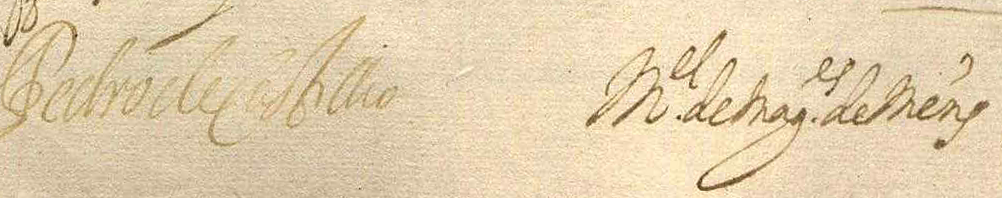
Pedro de Castilho M.el de Mag.es de Men̄s
